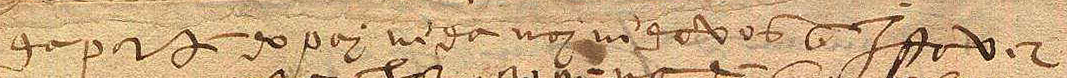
da parte do paj nē da may nē davos q̄ Jsta ver
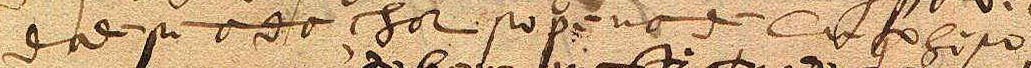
dade se a dachar so pena de eu p̄o heso
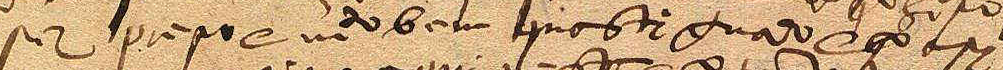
ser preso e mto bem quastyguado e p̄o asy
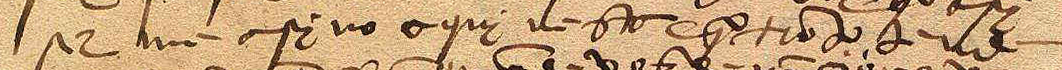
ser me asyno aquy nesta e p̄otāto tende
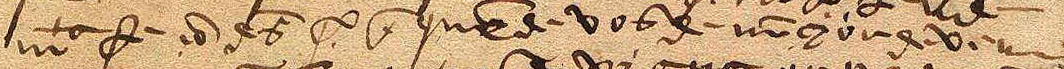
mta fe cō des̄ p̄oq̄ quē de vos denucyou devem
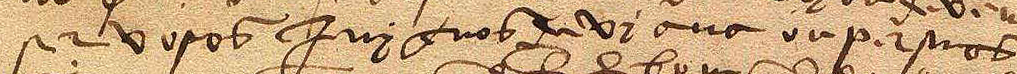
ser vosos Jmyguos de vyana ou per suas
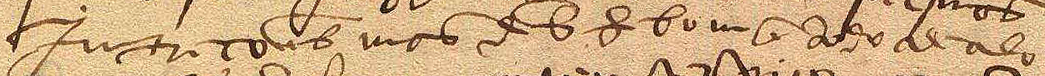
Jntreções mas des̄ he bom q̄ todo ade alo
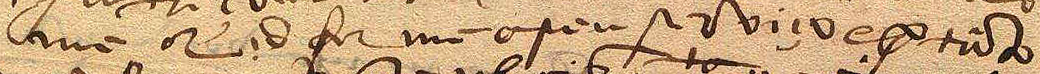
mear cōforme a seu serviço e p̄otāto
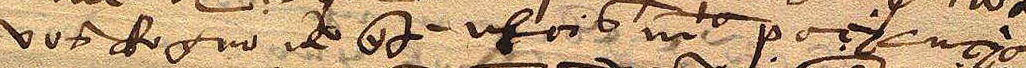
vos Roguo mto q̄ tenhais mta pacyencya
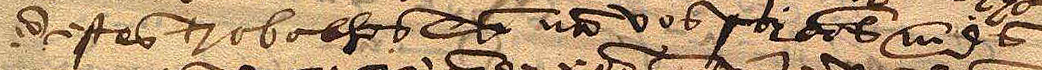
cō estes trabalhos e q̄ nā vos sayaes nē des
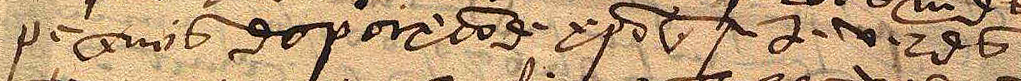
pegueis da paixā de xpō q̄ se teverdes
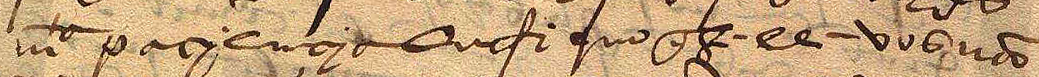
mta pacyencya eu fiquo q̄ helle vos nā
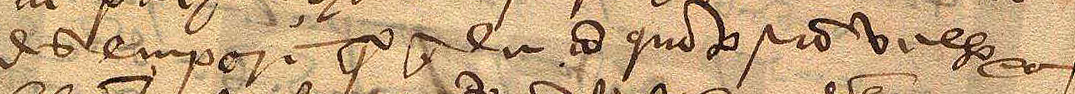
desempare p̄oq̄ eu cōquāto sā velho e a
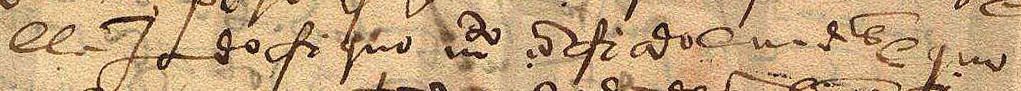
lleJado fiquo mto cōfiado em des̄ e quo
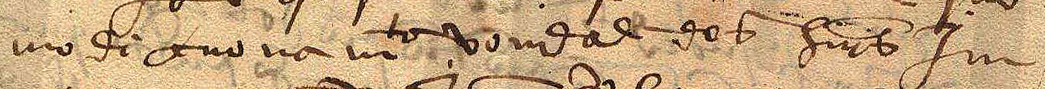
mo diguo na mta vondade dos Snōs Jm
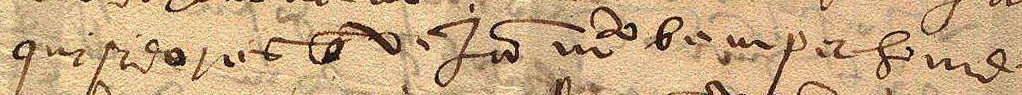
quisidores q̄ veJā mto bem per honde
